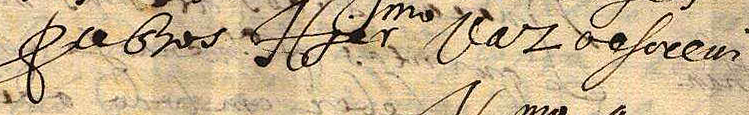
ꝓcessos Hjermo Vaz o escreui
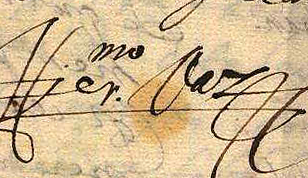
Hjermo Vaz
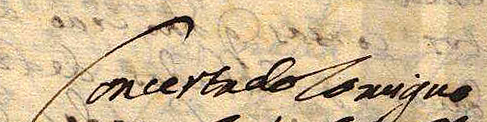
Concertado comiguo
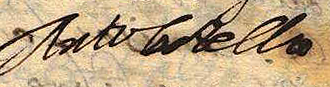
Anto botelho
